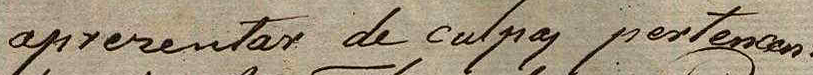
aprezentar de culpas pertencen
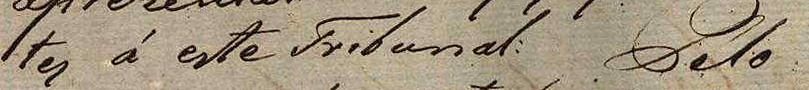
tes á este Tribunal: Pelo
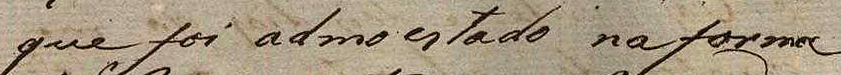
que foi admoestado na forma
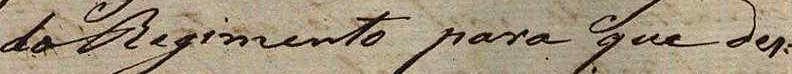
do Regimento para que des
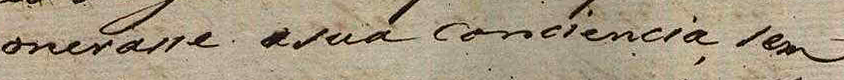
onerasse a sua conciencia, sem
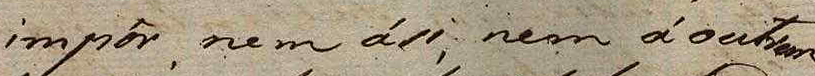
impôr, nem á si, nem á outrem
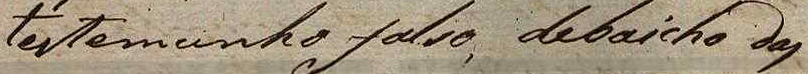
testemunho falso, debaicho das
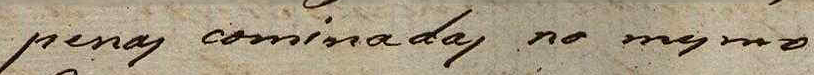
penas cominadas no mesmo
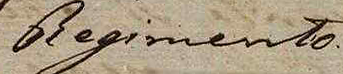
Regimento
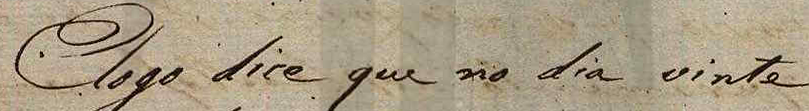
E logo dice que no dia vinte
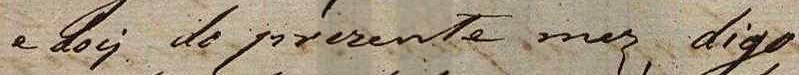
e dois do prezente mez, digo
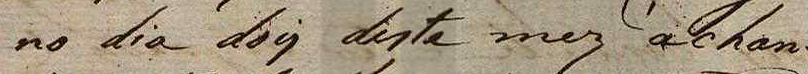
no dia dois deste mez achan
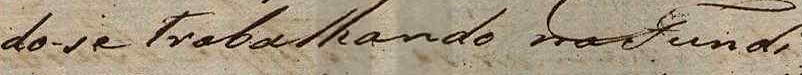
do-se trabalhando na Fundi
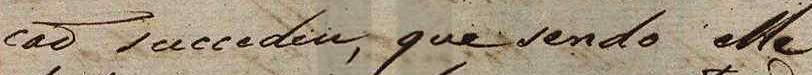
çaõ succedeu, que sendo elle
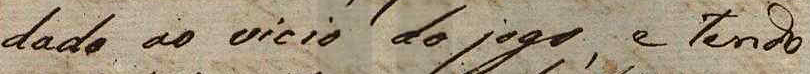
dado ao vicio do jogo, e tendo
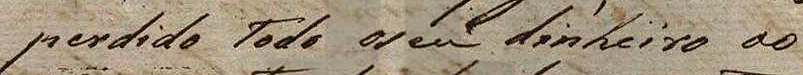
perdido Todo o seu dinheiro ao
